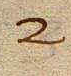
2
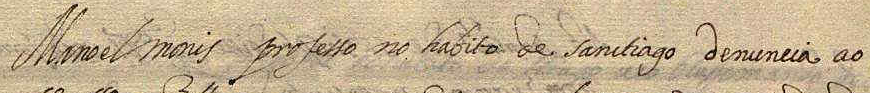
Manoel monis professo no habito de sanctiago denuncia ao
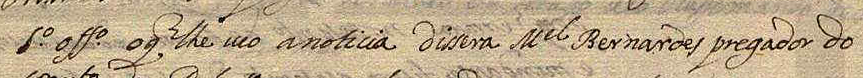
s.o off.o o q̄ lhe ueo a noticia dissera Mel Bernardes pregador do
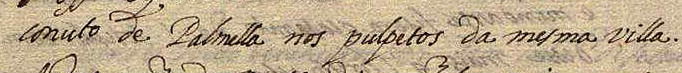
conuto de Palmella nos pulpetos da mesma villa.
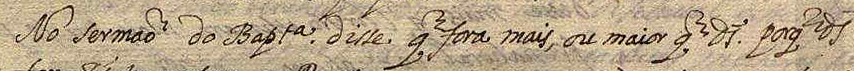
No sermaõ do Bapta disse q̄ fora mais, ou maior q̄ Ds̄ porq̄ Ds̄
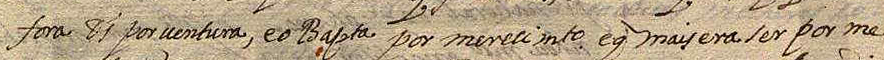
fora Ds̄ por uentura, e o Bapta por merecimto. e q̄ mais era ser por me
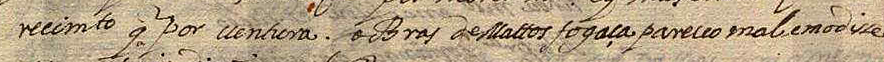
recimto q̄ por uentura. o Bras de Mattos fogaça pareceo mal e mo disse
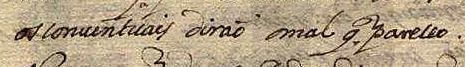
os conuentuais diraõ o mal q̄ pareceo.
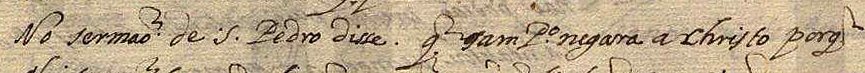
No sermaõ de S. Pedro disse q̄ sam P.o negara a Christo porq̄
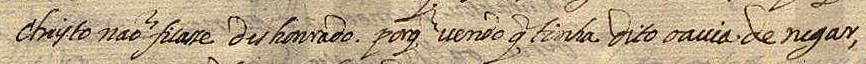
Christo naõ ficase deshonrado. porq̄ uendo q̄ tinha dito o auia de negar,
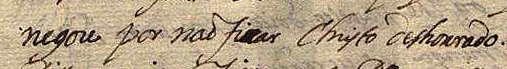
negou por naõ ficar Christo deshonrado.
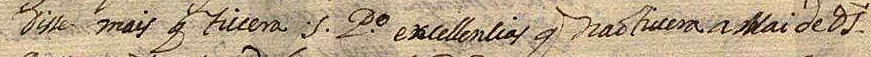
Disse mais q̄ tiuera .S. P.o excellencias q̄ naõ tiuera a Mai de Ds̄.
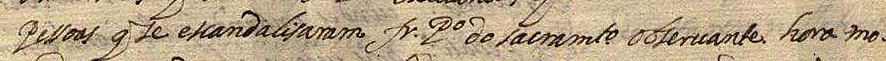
Pessoas q̄ se escandalisaram fr. Po do Sacramto obseruante hora mo
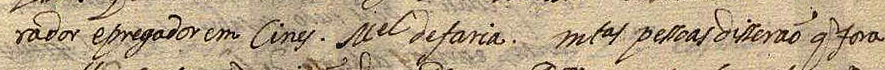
rador e pregador em Cines. Mel de faria. mtas pessoas disseraõ q̄ fora
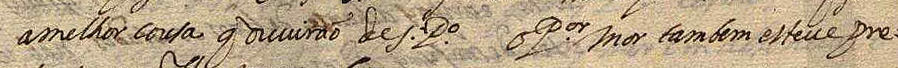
a melhor cousa q̄ ouuiraõ de S. P.o o P.or mor tambem esteue pre
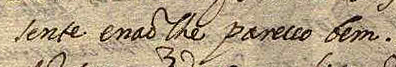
sente e naõ lhe pareceo bem.
